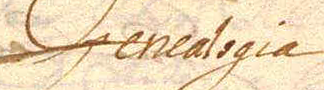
Genealogia
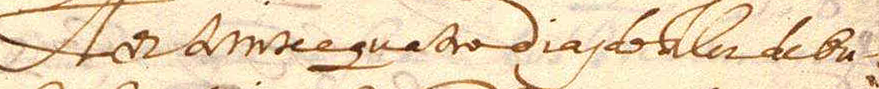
Aoz Vinte e quatro dias do Mez de Ou
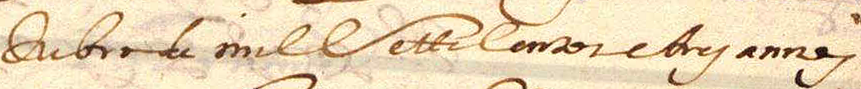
tubro e mil SetteCentos e tres annos
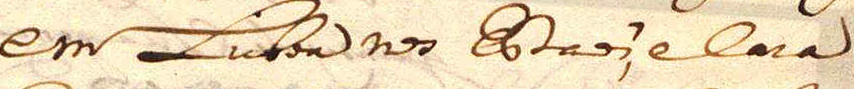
em Lisboa nos Estaós, e Caza
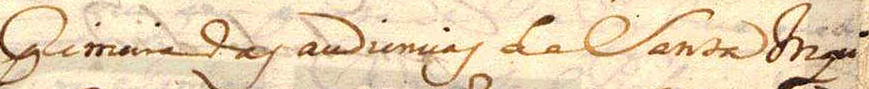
primeira das audiencias da Santa Inqui
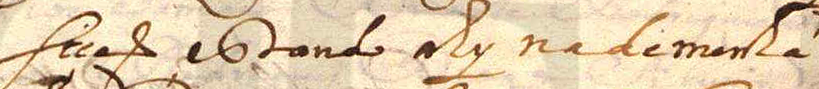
siçaõ, estando ahy na de manhã
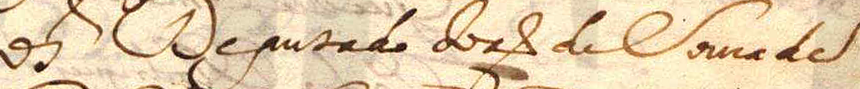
o s̄or Deputado Ioaõ de Souza de
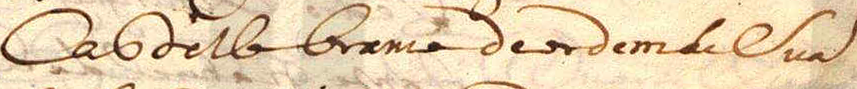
Castello branco da ordem de Sua
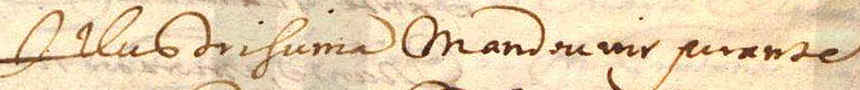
Jllustrissima Mandou uir perante
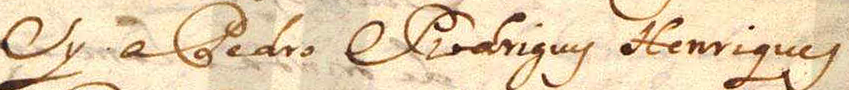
sy a Pedro Rodrigues Henriques
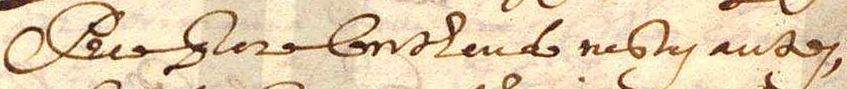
Reo prezo Contheudo nestes autos;
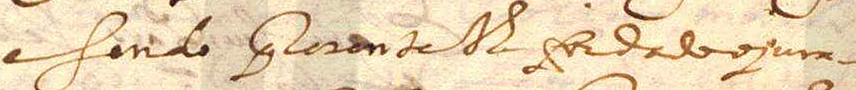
e sendo prezente lhe foi dado o jura
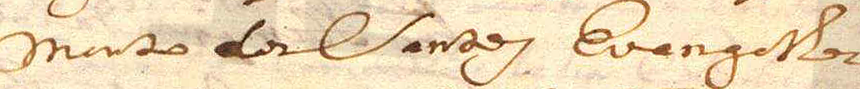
mento dos Santos Evangelhoz
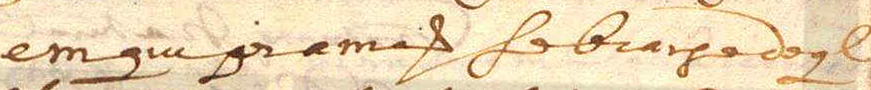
em que poz a maõ sob cargo do ql
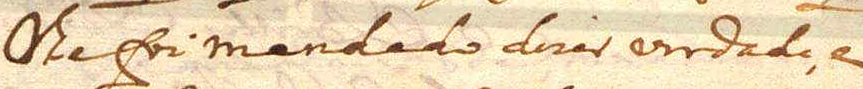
lhe foi mandado dizer verdade, e
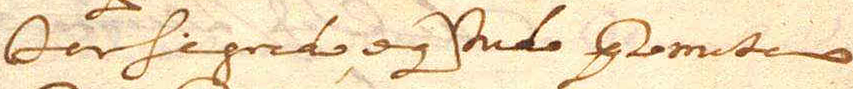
ter segredo, o q̄ tudo prometeo
